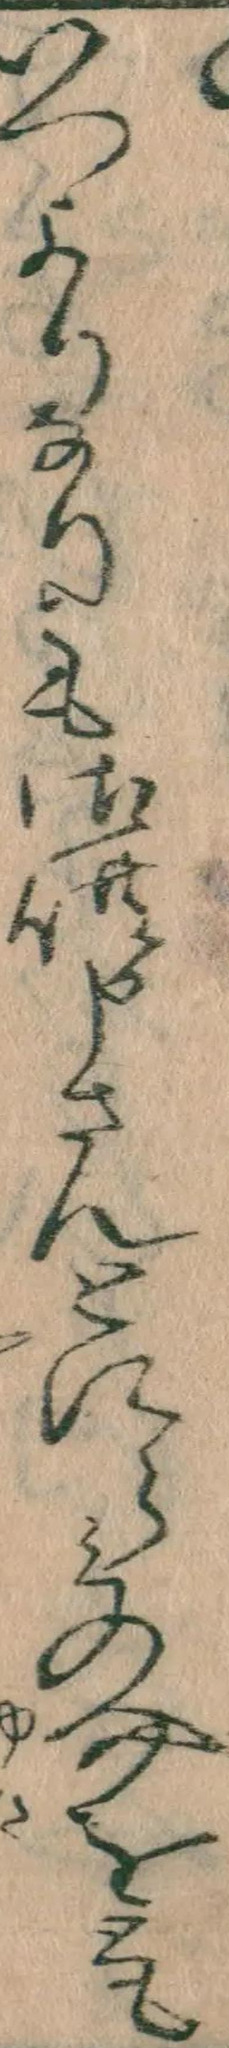いつよりなりとも御供申さんとにらみの介をとも
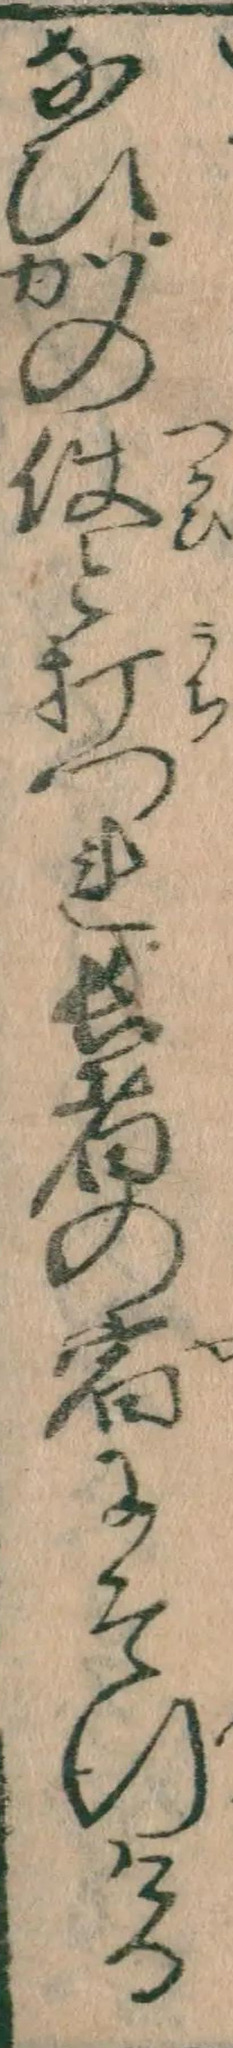なひ、かの使と打つれ長者の宿にそ行ける

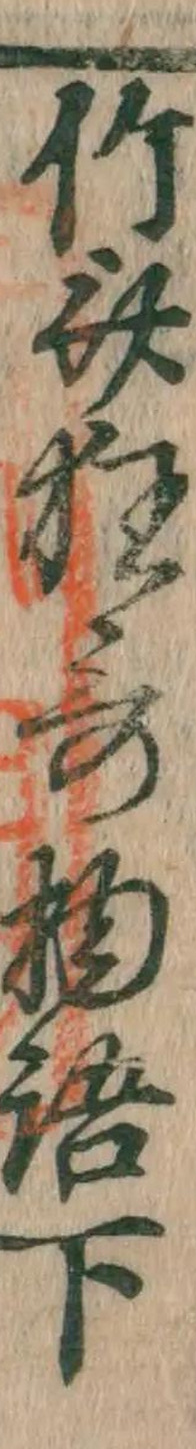竹斎狂歌物語下
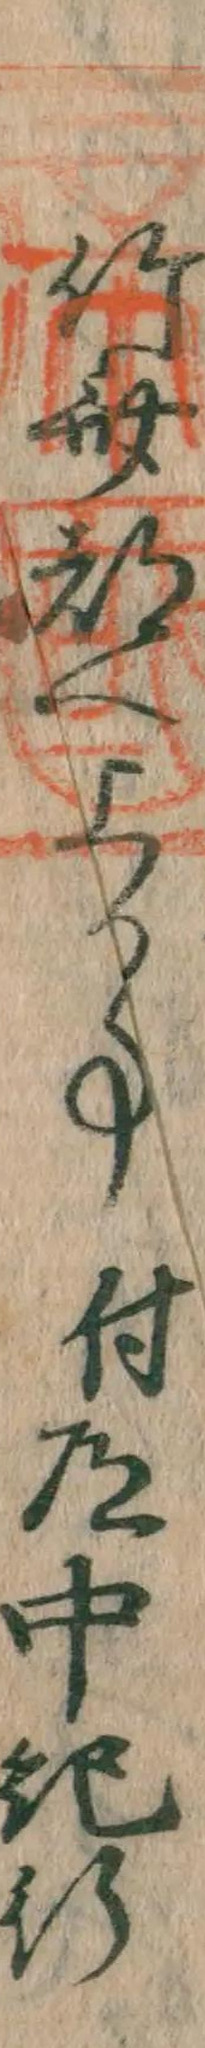竹斎都へ上る事付道中紀行
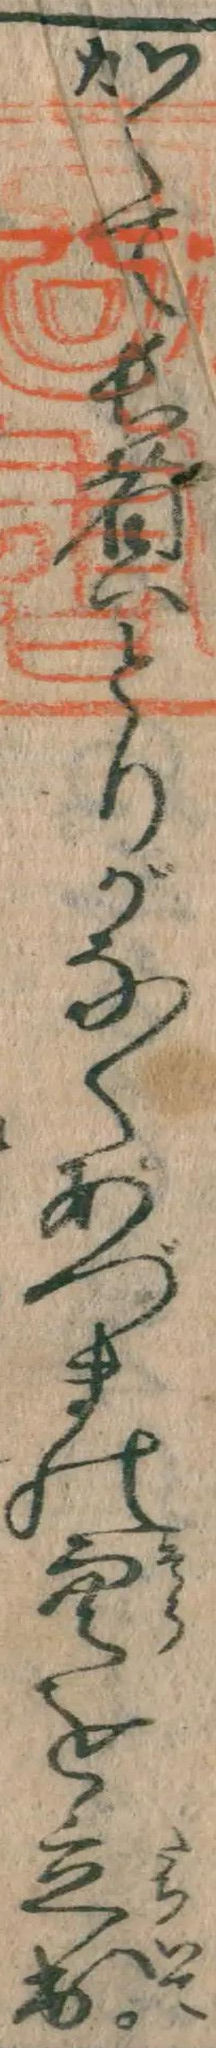かくて長者はとりがなくあづまの空を立出。
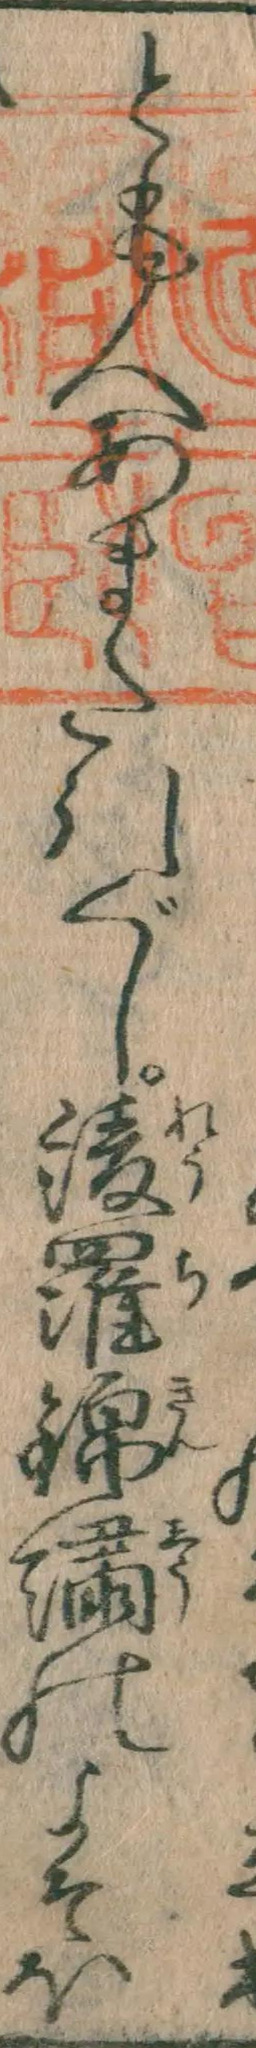とも人あまた引ぐし。綾羅錦繍のよそほ
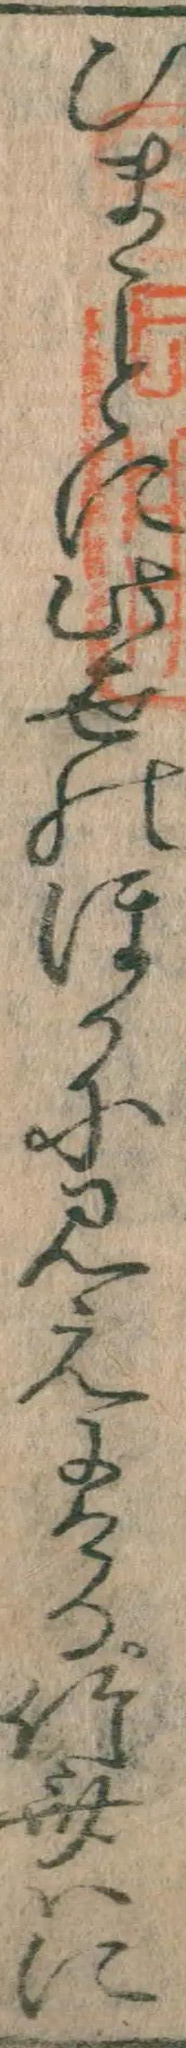ひまことに此世のほかに見えにける。竹斎はに
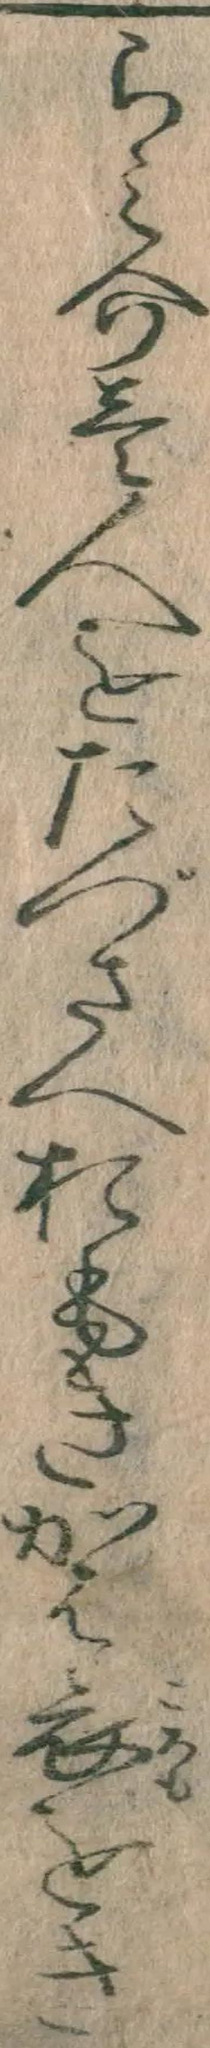らみ介壱人をたづさへおもきかは衣をき
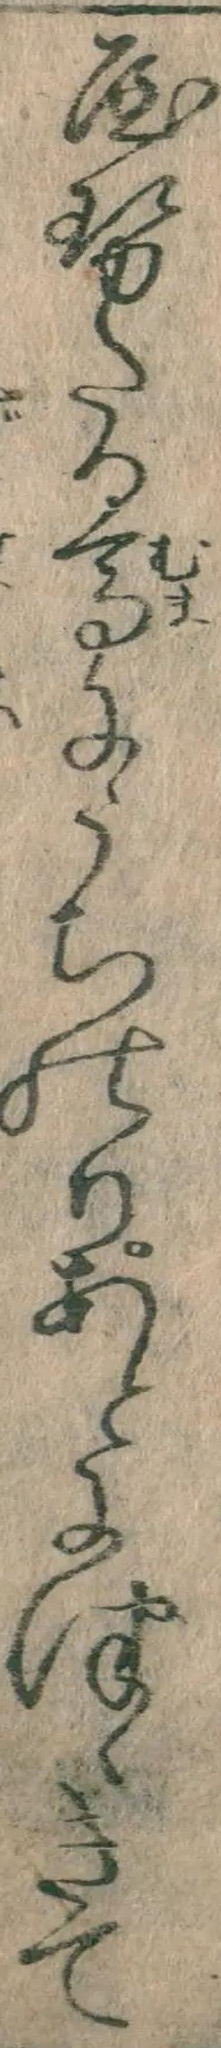やせたる馬にうちのり。あとにつゝきて
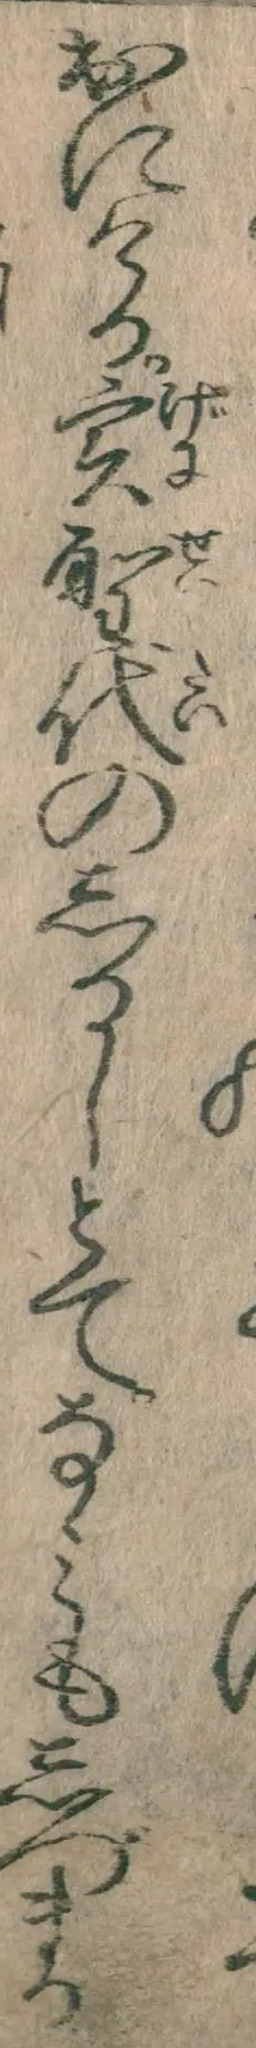出にける。実聖代のしるしとて。なみもしづまる
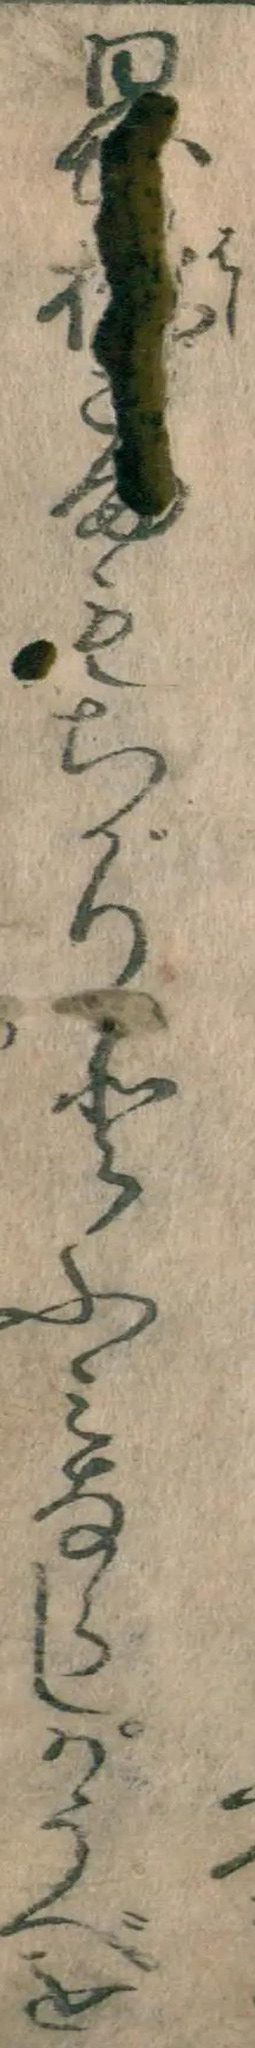もちがりとふみならし。かうべを
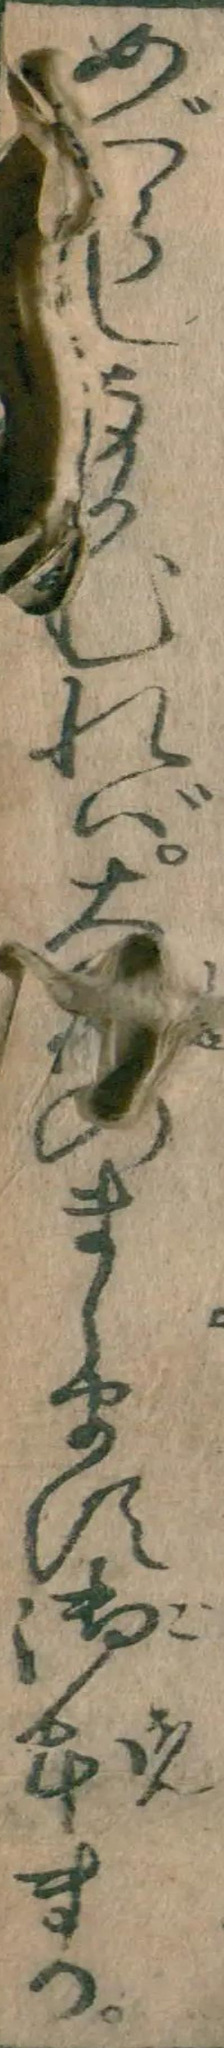めぐらしなかむれば。大まします御本まか。

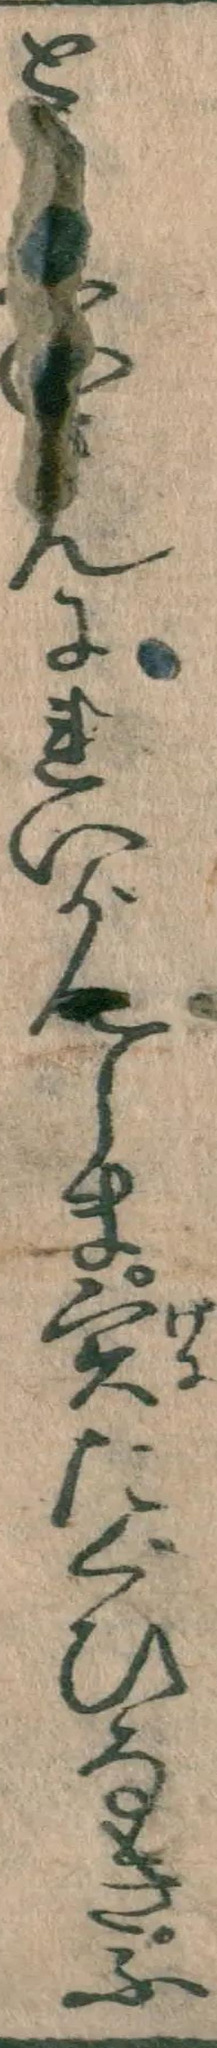とんに、れいがんしま。実たぐひなき。ふ
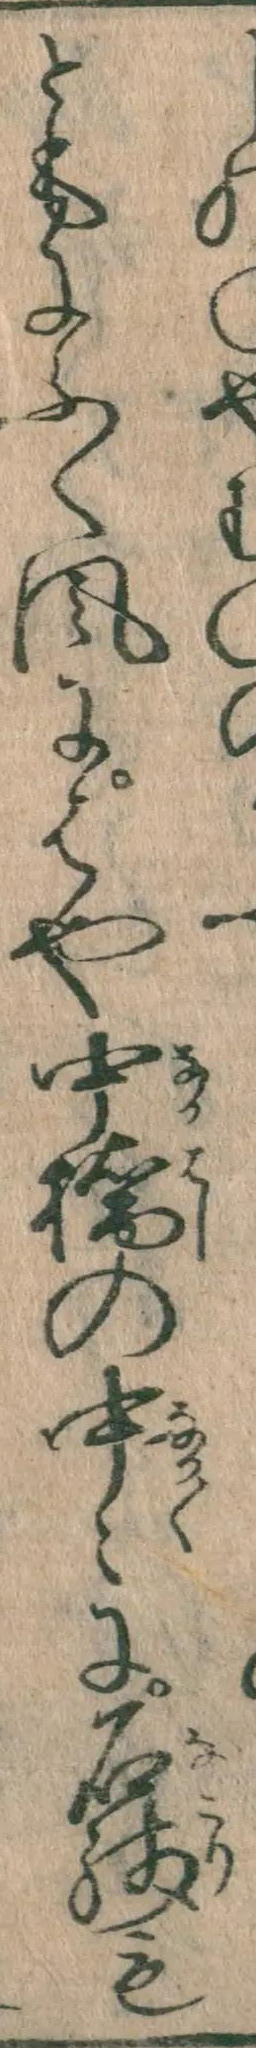ともに吹く風に。はや中橋の中々に。名残も
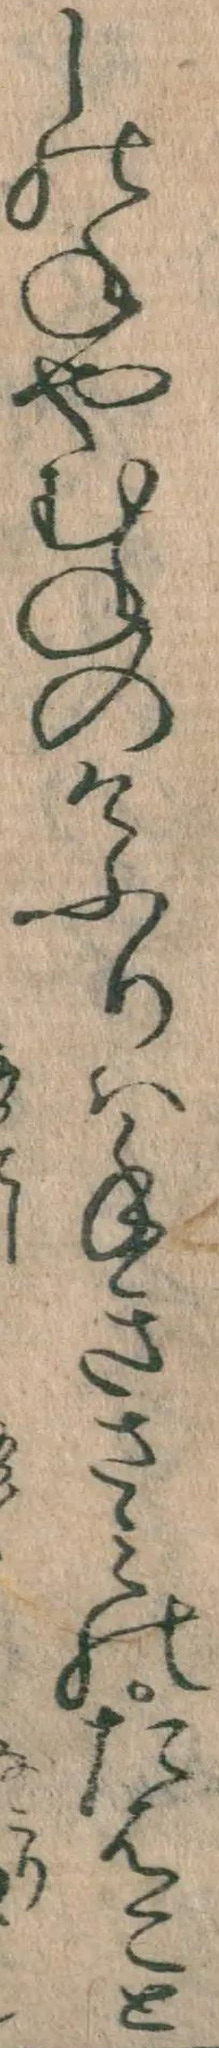しのねやむねのけふりは手きさみの。たはこと
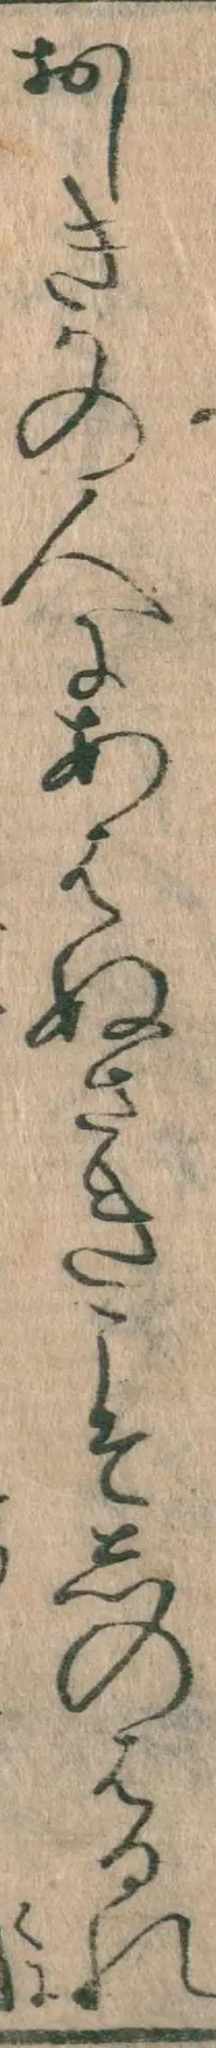おしきかの人にあはぬさきこそしのはるれ
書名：竹斎狂歌物語 3巻
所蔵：国立国会図書館 National Diet Library, JAPAN
